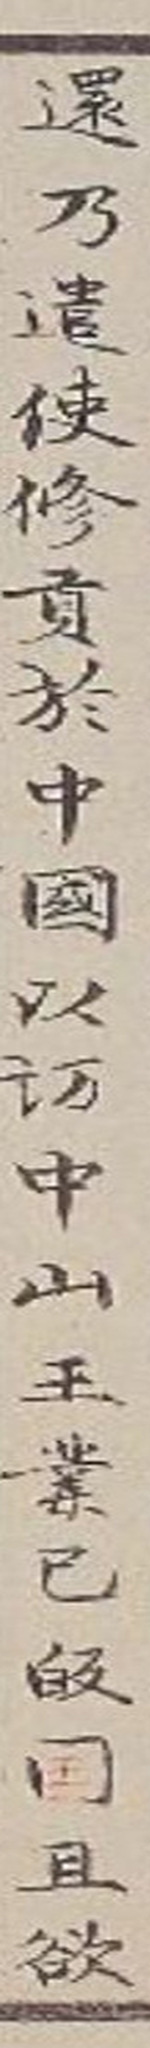還乃遣使修貢於中国以訪中山王業巳帰国且欲
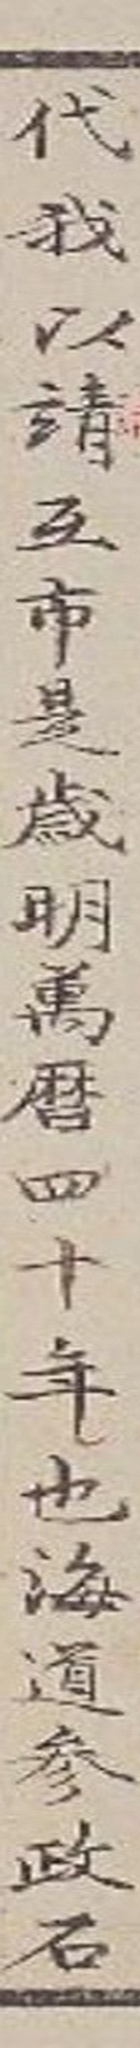代我以靖請互市是歳明万暦四十年也海道参政石
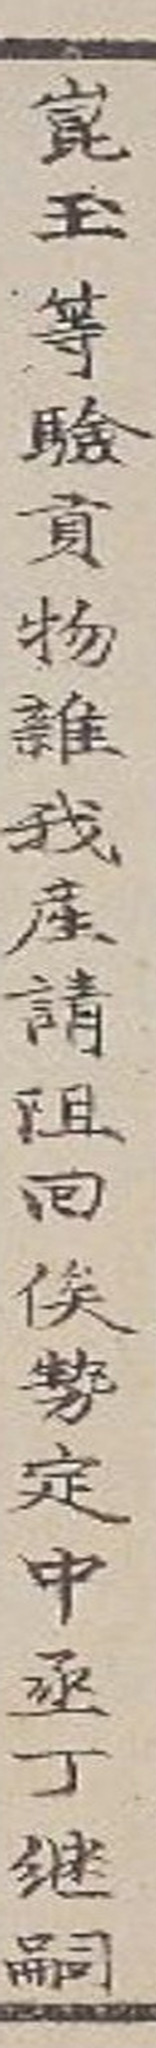崑玉等験貢物雑我産請阻回俟勢定中丞丁継嗣
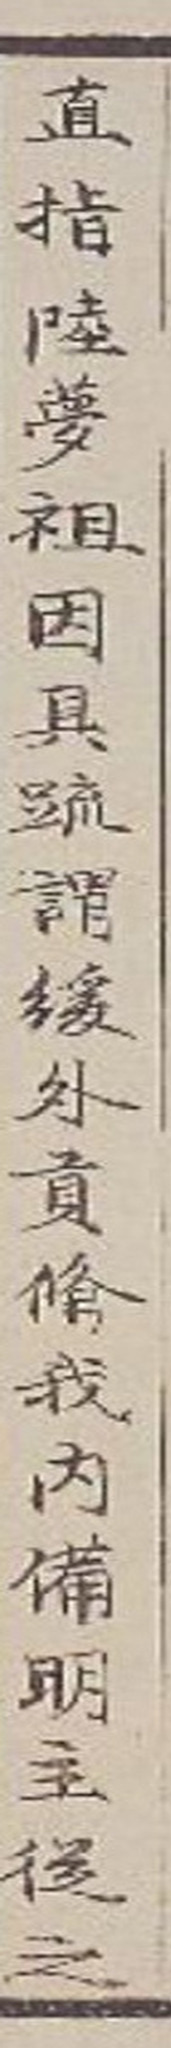直指陸夢祖因具疏謂緩外貢修我内備明主従之
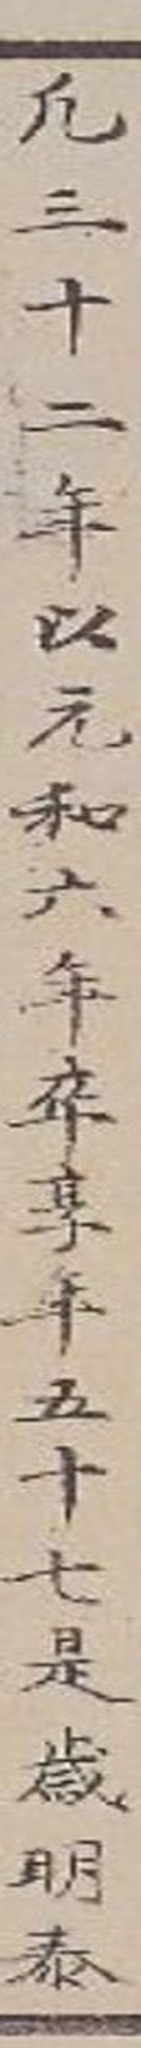凡三十二年以元和六年卒享年五十七是歳明泰

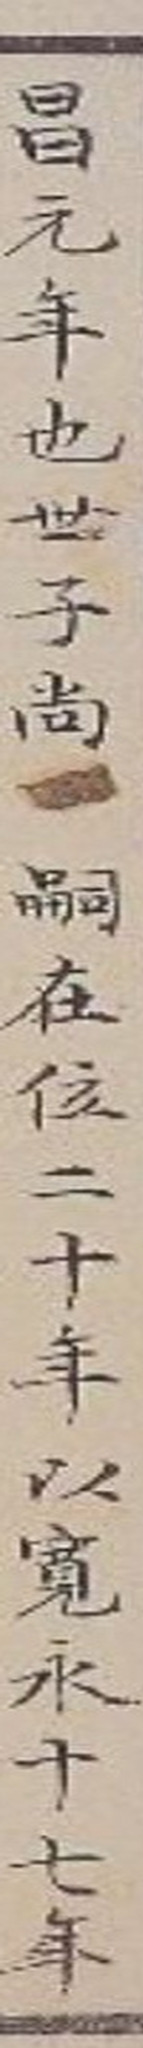昌元年也世子尚嗣在位二十年以寛永十七年
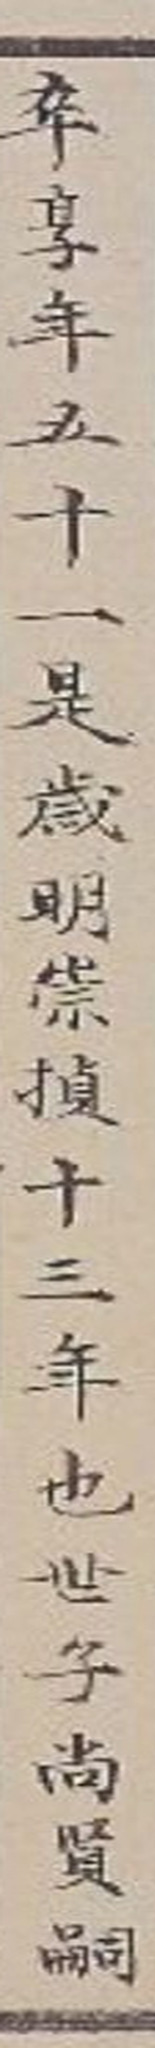卒享年五十一是歳明崇揁十三年也世子尚賢嗣
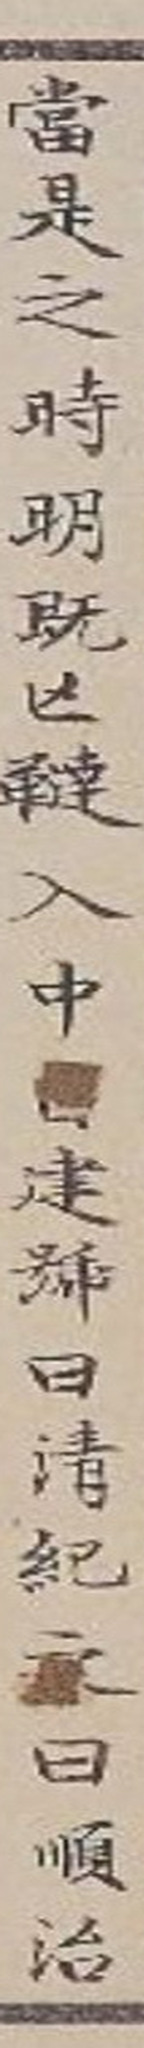当是之時明既亡韃入中建号曰清紀元曰順治
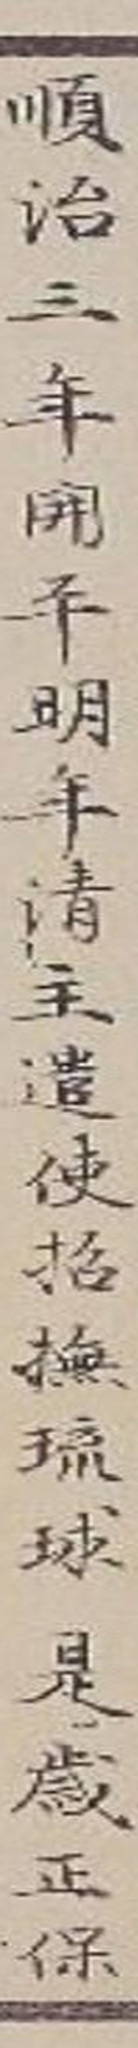順治三年開平明年清主遣使招撫琉球是歳正保
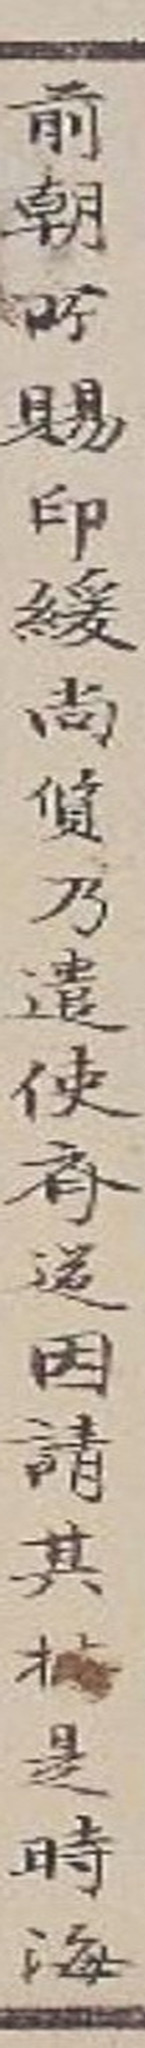前朝所賜印緩尚質乃遣使斉送因請其是時海
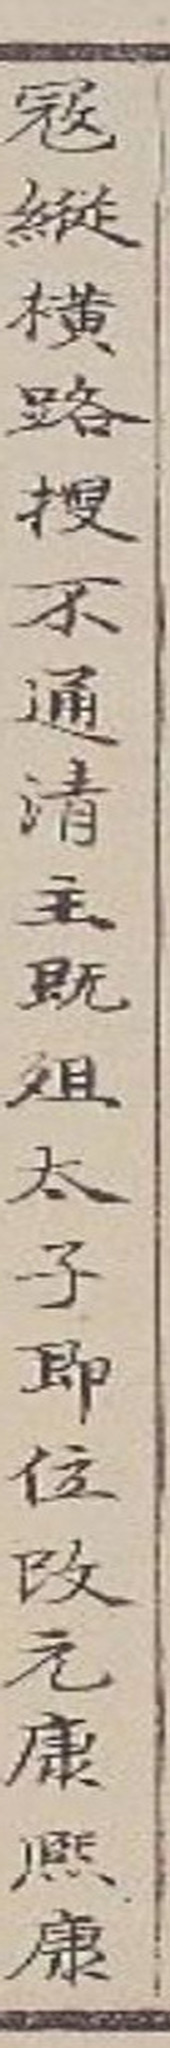寇縦横路捜不通清主既殂太子即位改元康熙康
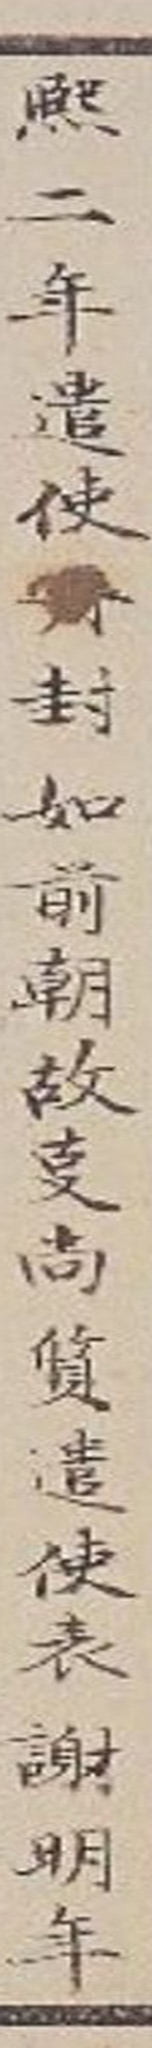熙二年遣使冊封如前朝故事尚質遣使表謝明年
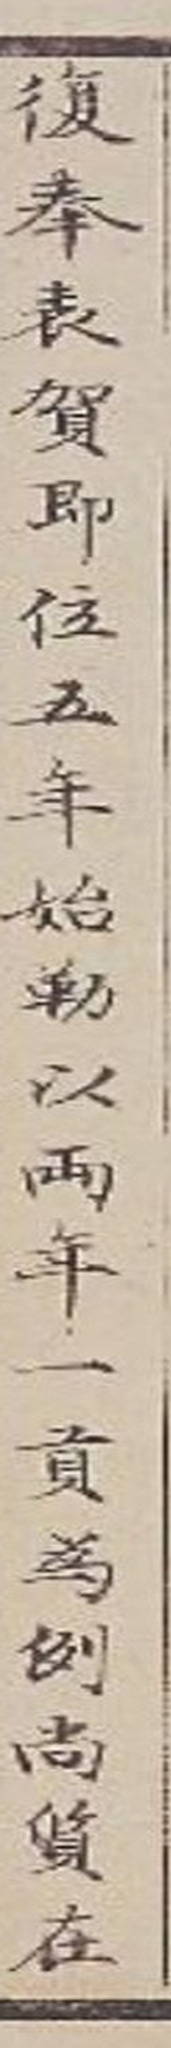復奉表賀即位五年始勅以両年一貢為例尚質在
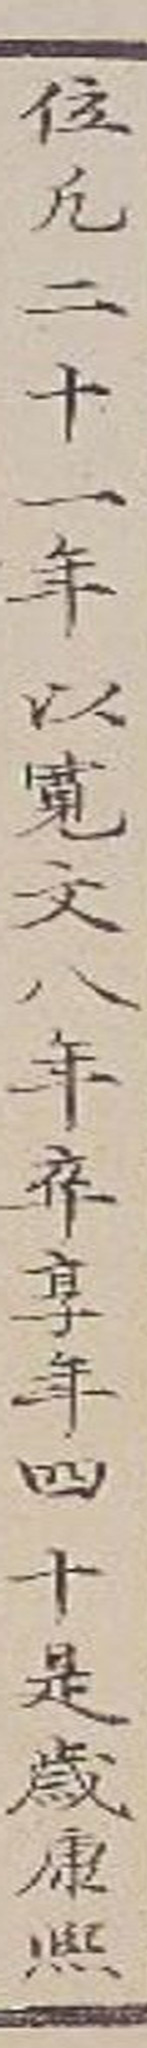位凡二十一年以寛文八年卒享年四十是歳康熙
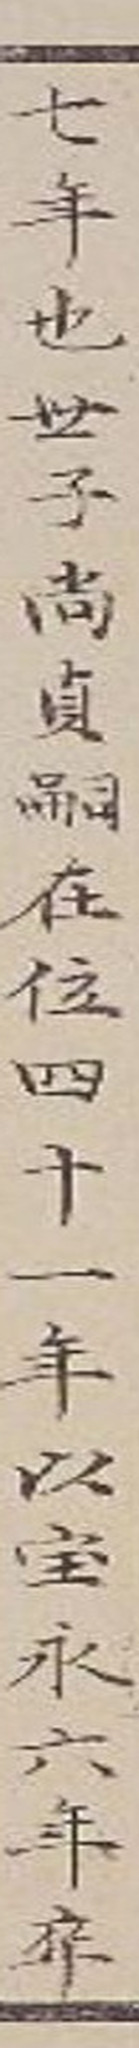七年也世子尚貞嗣在位四十一年以宝永六年卒
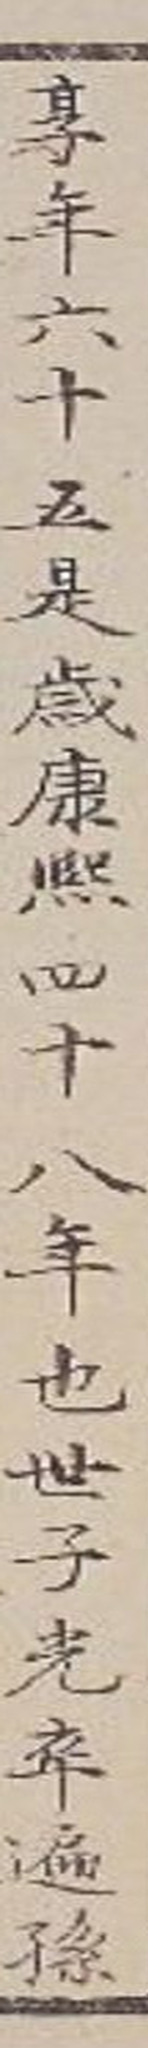享年六十五是歳康熙四十八年也世子光卒遍孫
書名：南島志 全
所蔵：University of the Ryukyus Library
